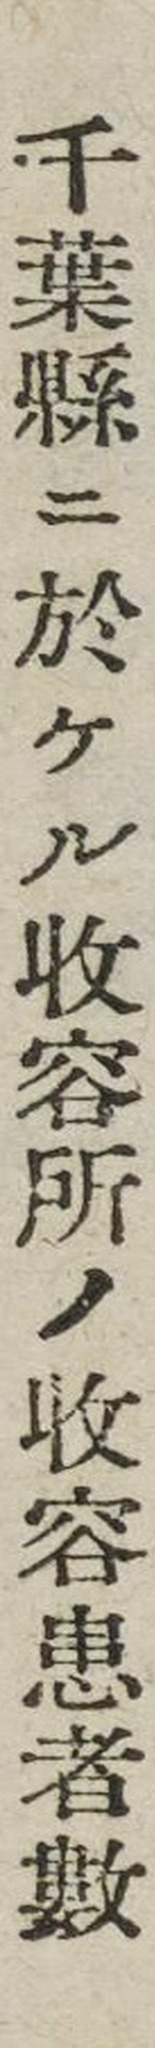千葉県ニ於ケル収容所ノ収容患者数
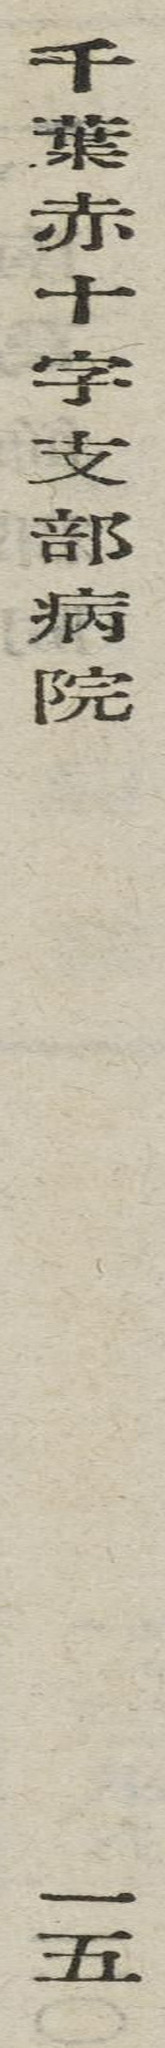千葉赤十字支部病院一五
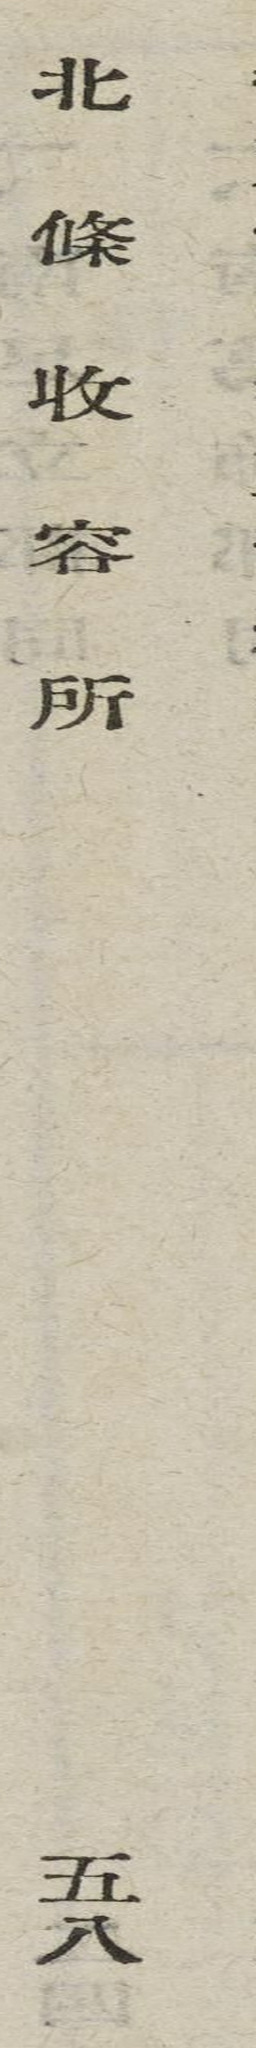北條収容所五八
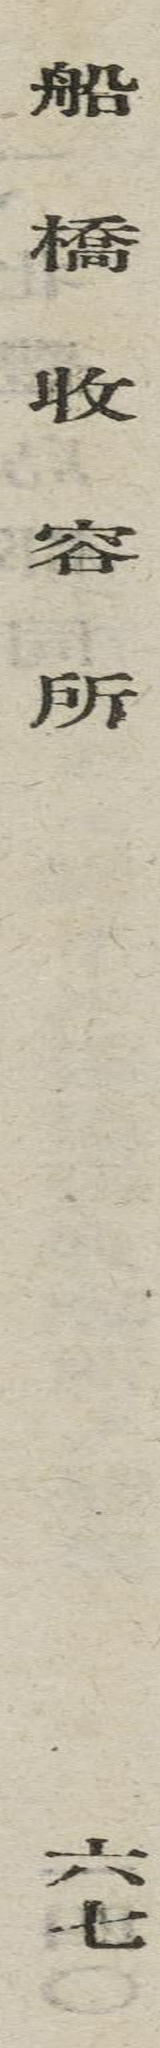舟橋収容所六七
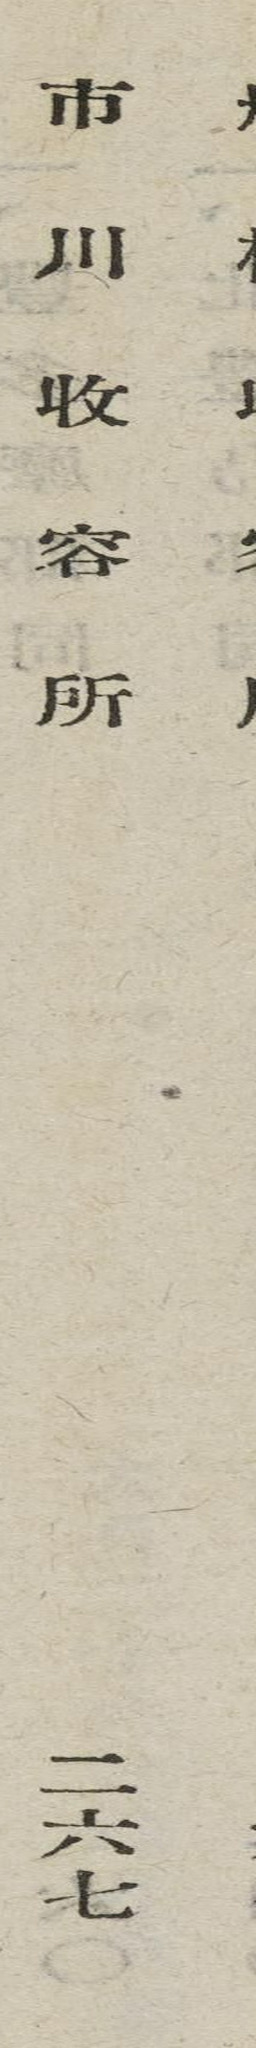市川収容所二六七
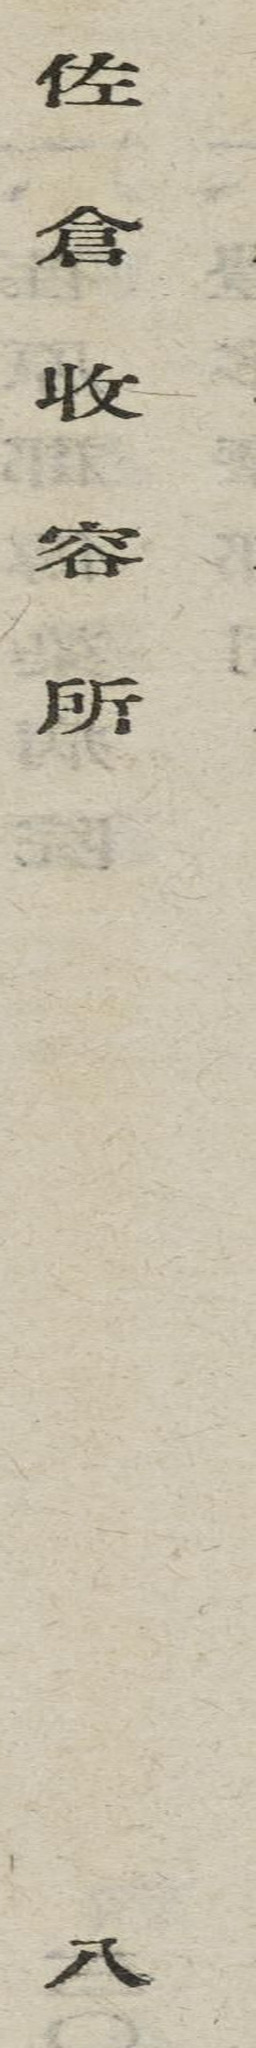佐倉収容所八
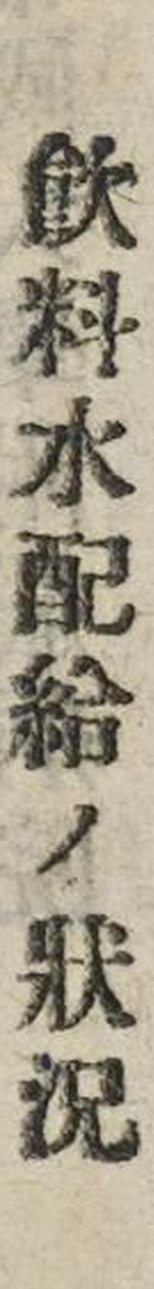飲料水配給ノ状況
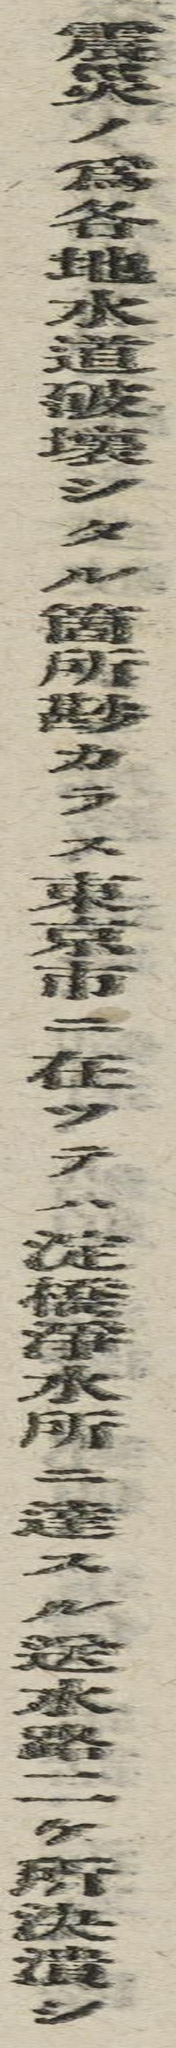震災ノ為各地水道破壊シタル箇所尠カラス東京市ニ在ツテハ淀橋浄水所ニ達スル送水路ニケ所決潰シ
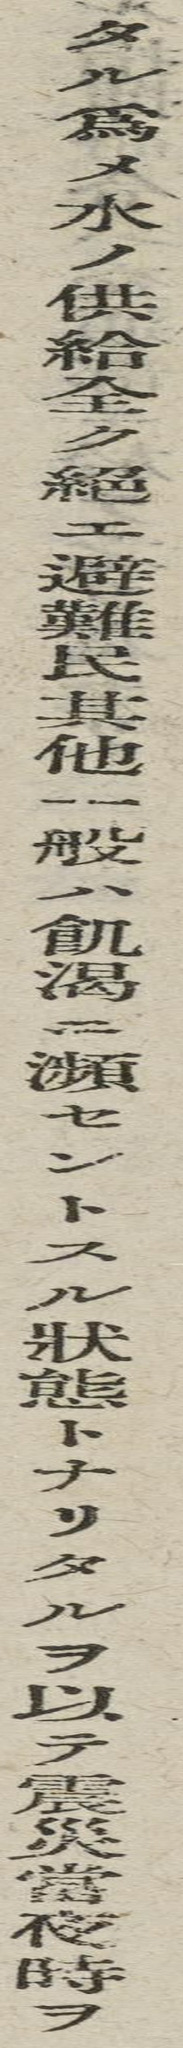タル為メ水ノ供給全ク絶エ避難民其他一般ハ飢渇ニ瀕セントスル状態トナリタルヲ以テ震災当夜時ヲ
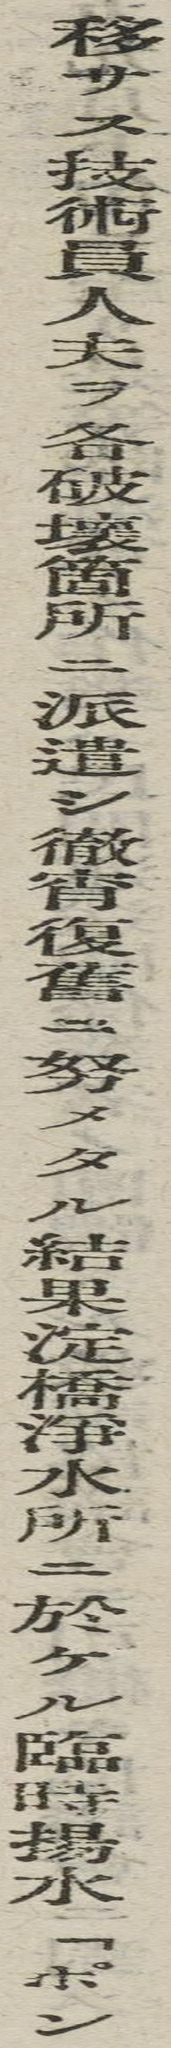移サス技術員人夫ヲ各破壊箇所ニ派遣シ徹宵復旧ニ努メタル結果淀橋浄水所ニ於ケル臨時揚水「ポン
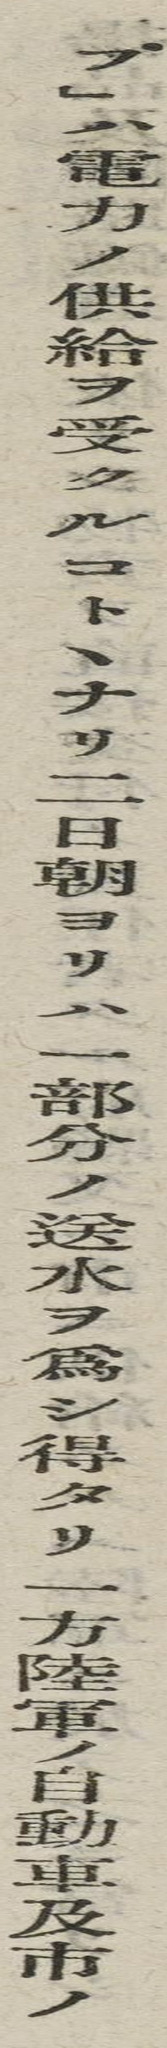プ」ハ電力ノ供給ヲ受クルコトヽナリ二日朝ヨリハ一部分ノ送水ヲ為シ得タリ一方陸軍ノ自動車及市ノ
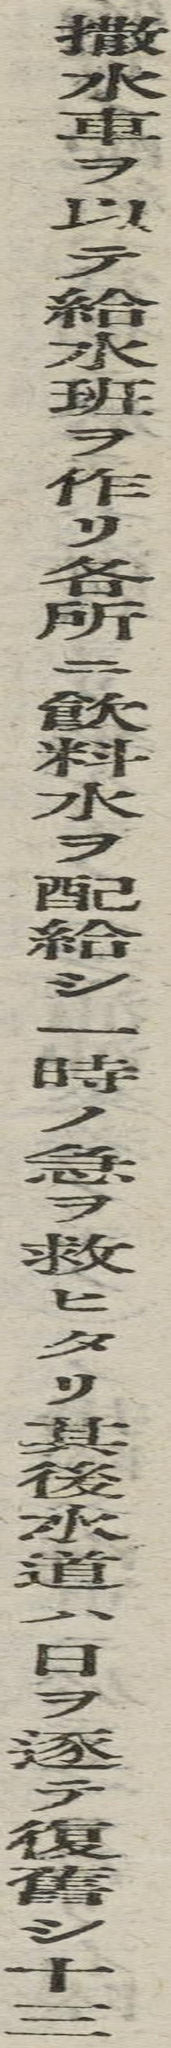散水車ヲ以テ給水班ヲ作リ各所ニ飲料水ヲ配給シ一時ノ急ヲ救ヒタリ其後水道ハ日ヲ遂テ復旧シ十三
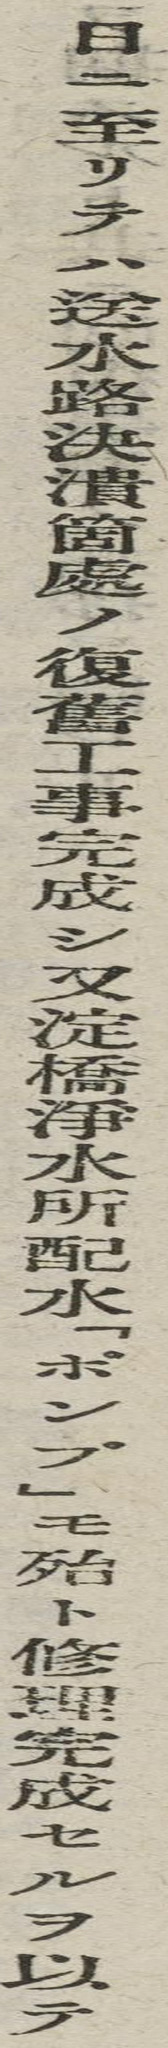日ニ至リテハ送水路決潰箇処ノ復旧工事完成シ又淀橋浄水所配水「ポンプ」モ殆ト修理完成セルヲ以テ
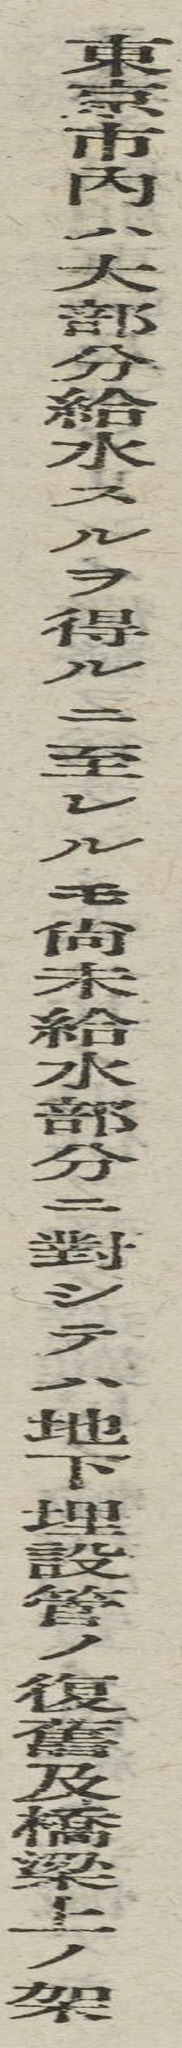東京市内ハ大部分給水スルヲ得ルニ至レルモ尚未給水部分ニ対シテハ地下埋設管ノ復旧及橋梁上ノ架
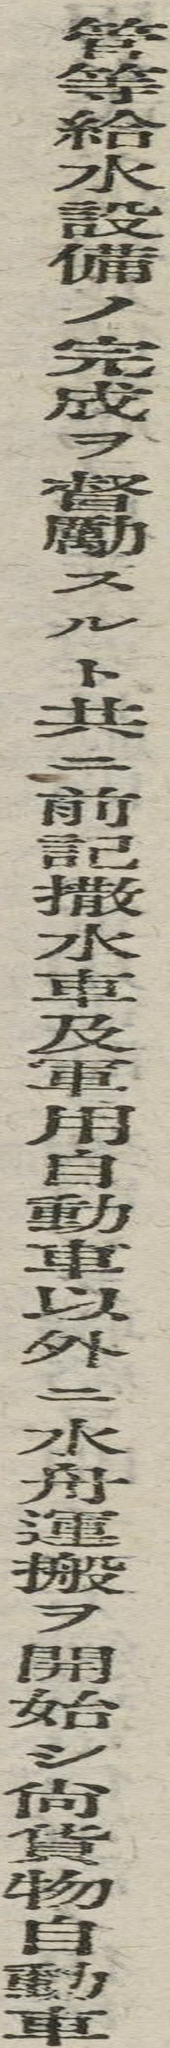管等給水設備ノ完成ヲ督励スルト共ニ前記散水車及軍用自動車以外ニ水舟運搬ヲ開始シ尚貨物自動車
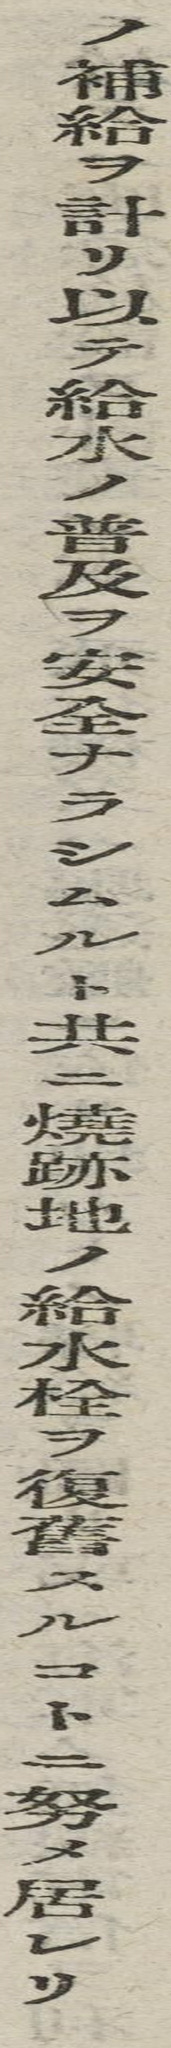ノ補給ヲ計リ以テ給水ノ普及ヲ安全ナラシムルト共ニ焼跡地ノ給水栓ヲ復旧スルコトニ努メ居レリ
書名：震災被害状況並救護施設概要
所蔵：東京大学地震研究所図書室 Earthquake Research Institute Library, The University of Tokyo, JAPAN
